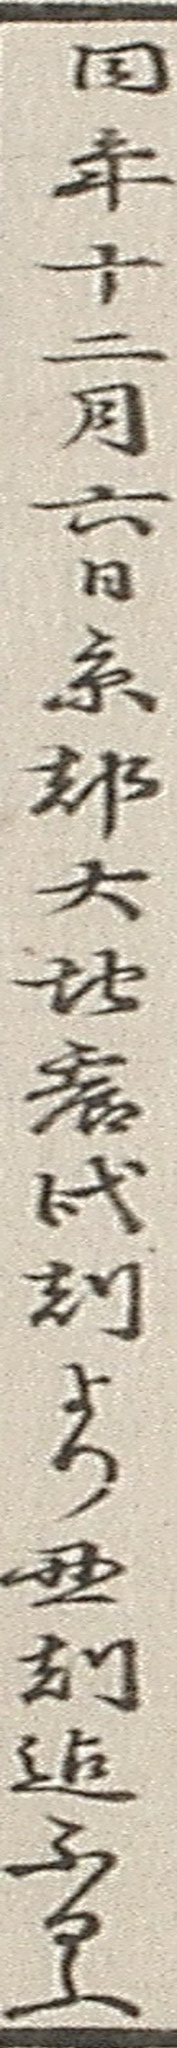同年十二月六日京都大地震戌刻より丑刻迄ふるふ
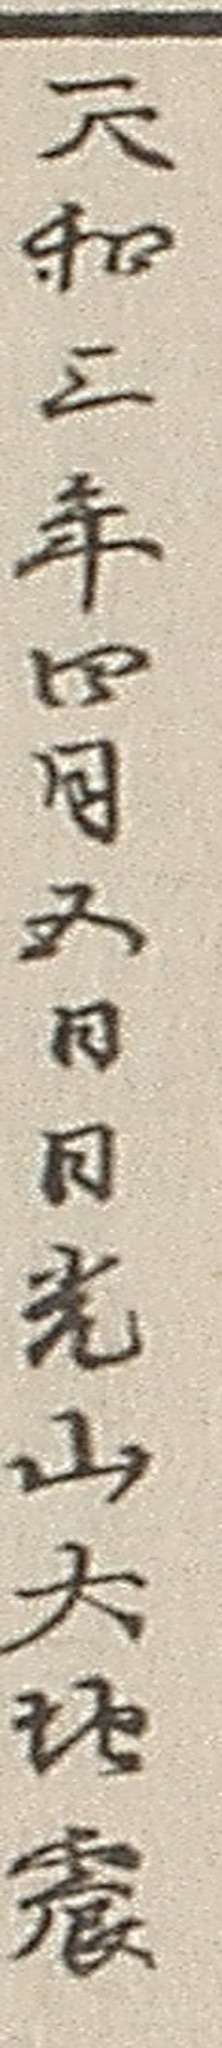天和三年四月五日日光山大地震
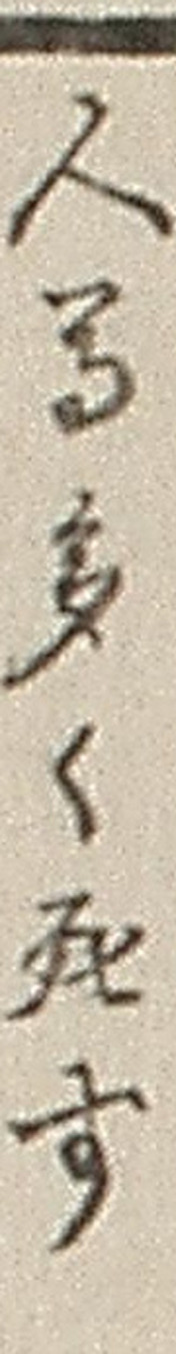人馬多く死す
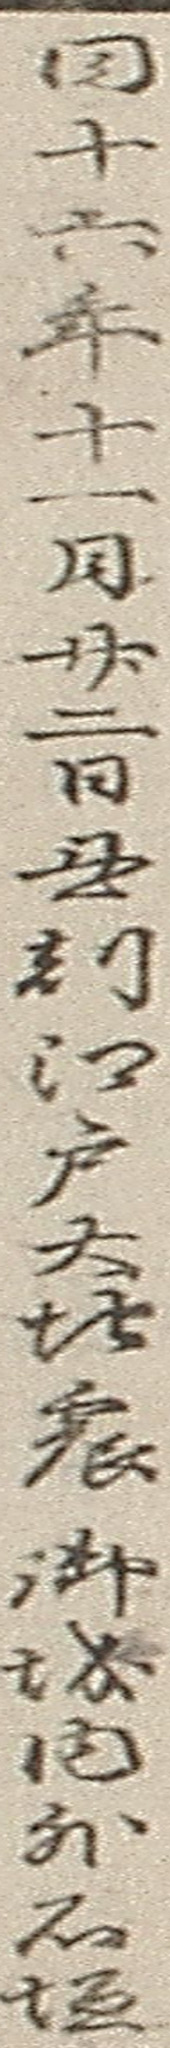同十六年十一月廿二日丑刻江戸大地震御城内外石垣

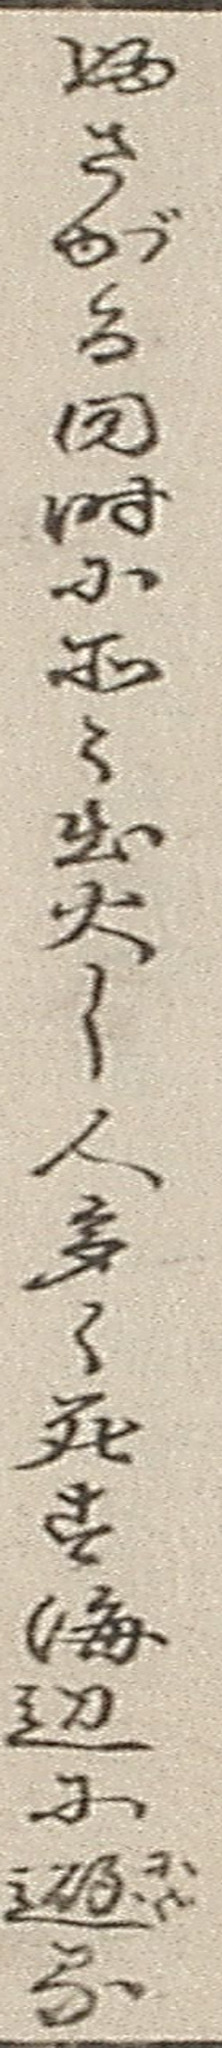ふさがる同時に所〻出火し人多く死す海辺に避る
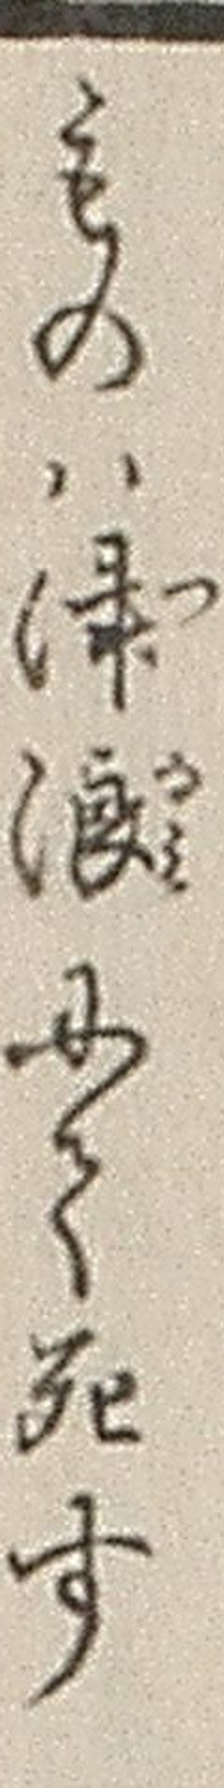ものは津浪にて死す
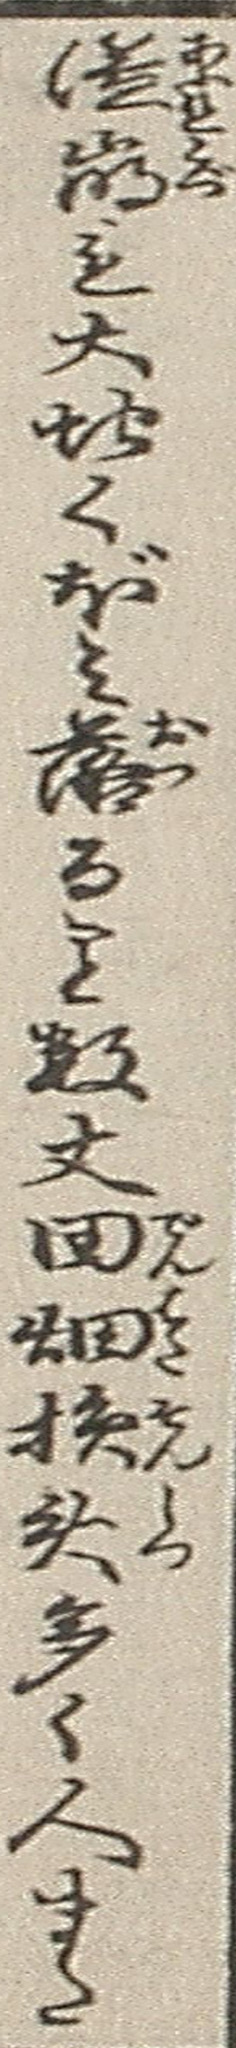溢崩れ大地くぼみ落ること数丈田畑損失多く人また
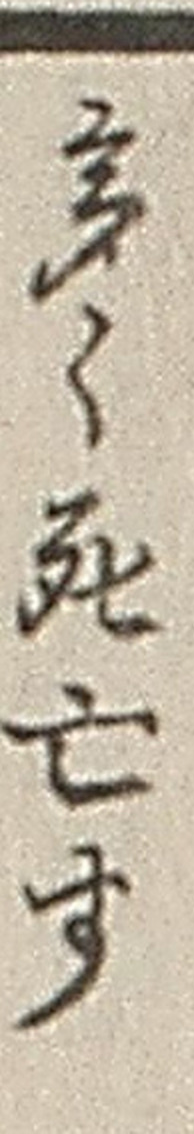多く死亡す
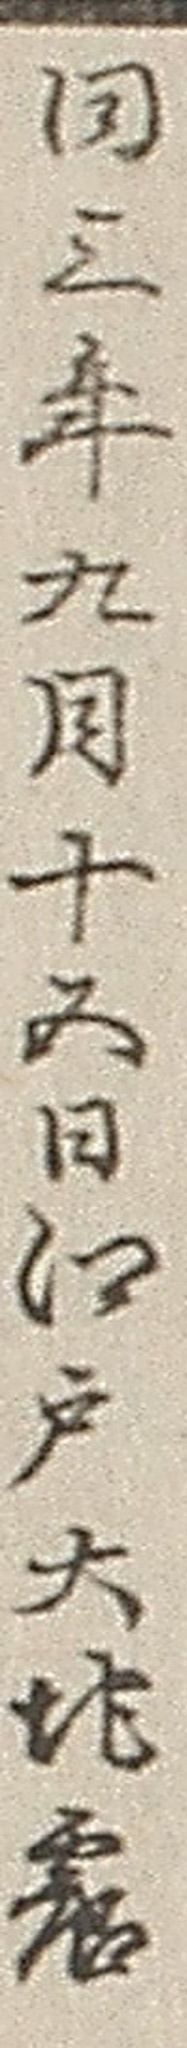同三年九月十五日江戸大地震
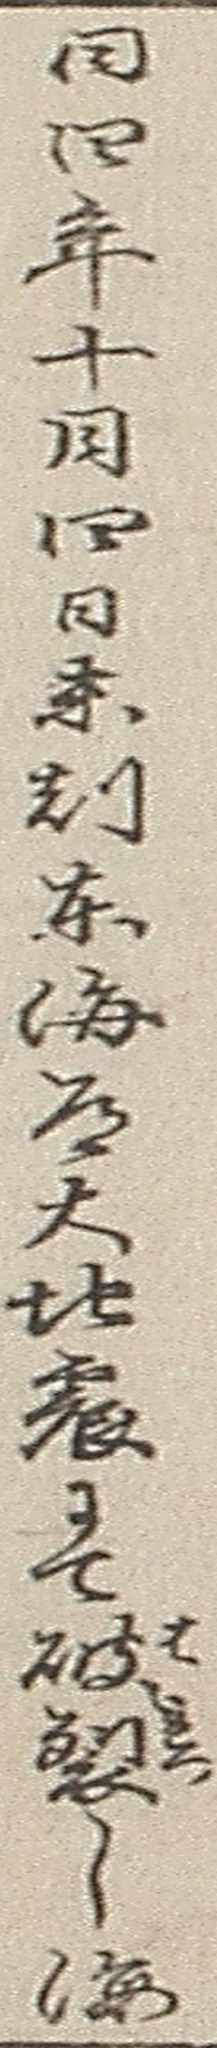同四年十月四日未刻東海道大地震にて破裂し海
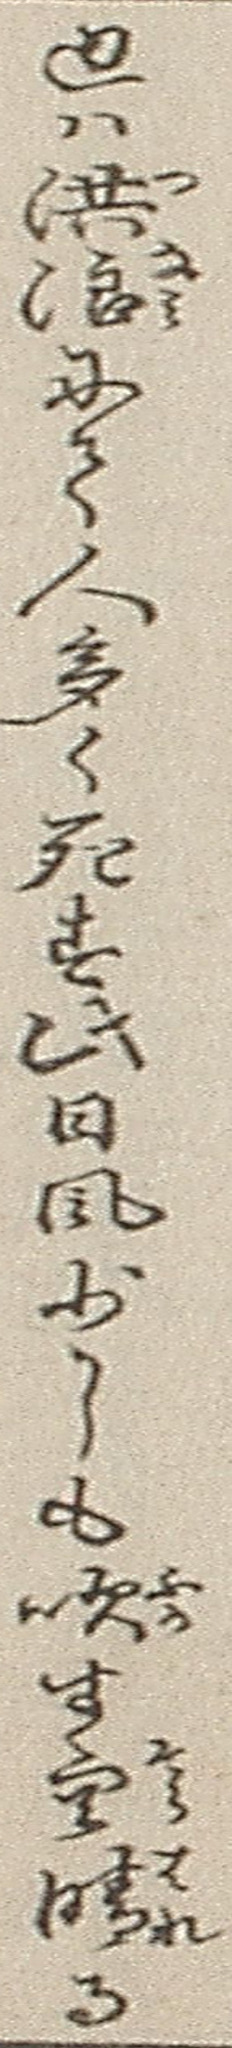辺は洪浪にて人多く死す此日風少しも吹す空晴る
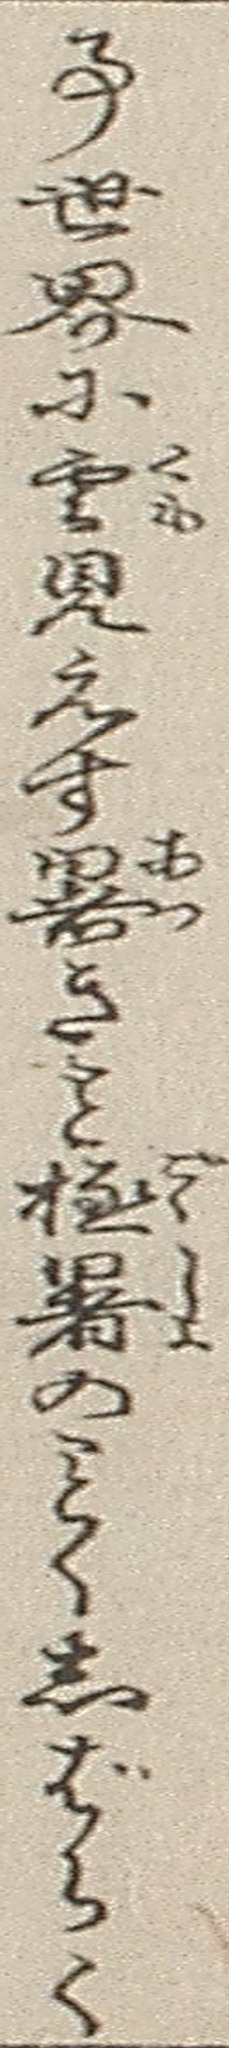事世界に雲見えす暑きこと極暑のことくしばらく

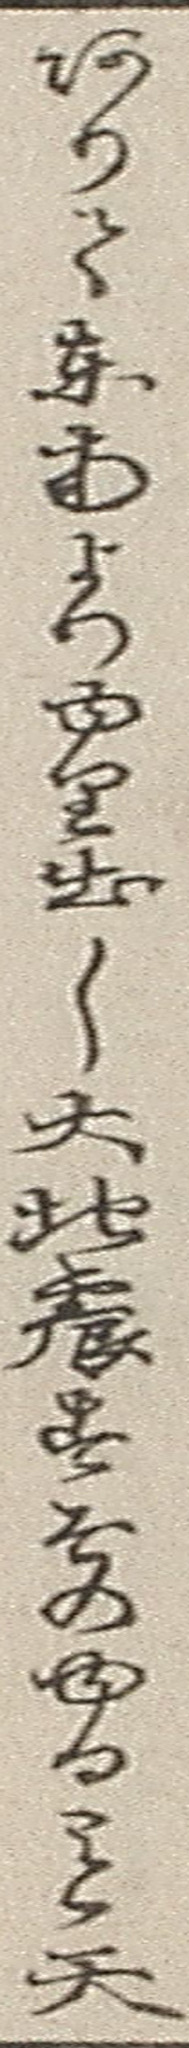ありて東南よりゆり出し大地震はそのゆること天
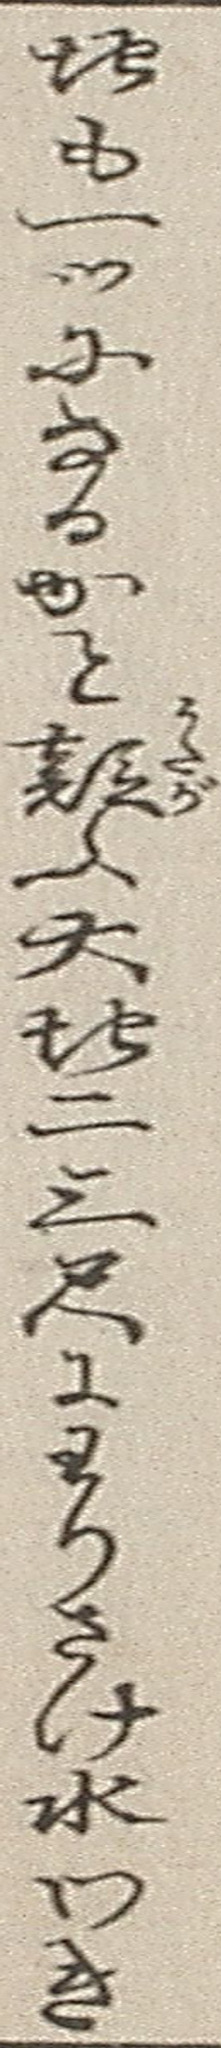地も一ツになるかと疑ふ大地二三尺にわりさけ水わき
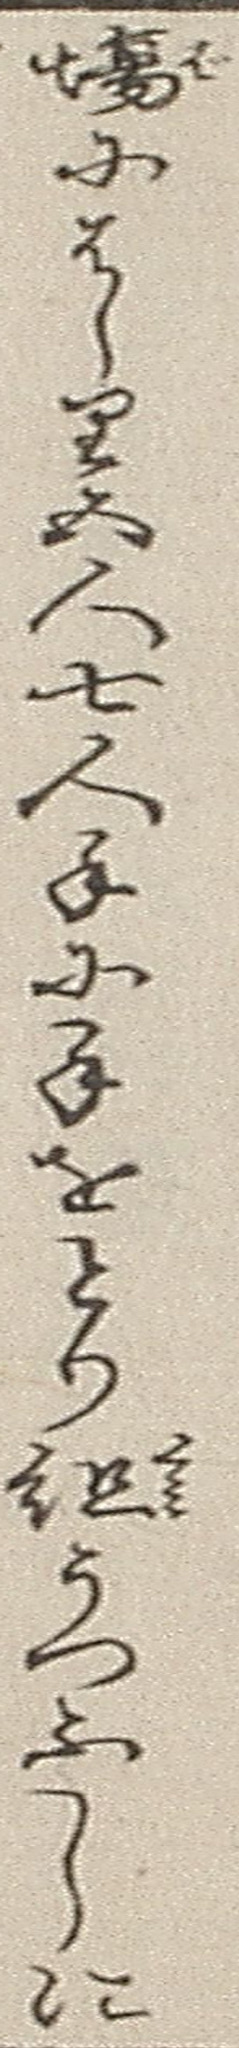場にはしり五人七人手に手をとり組うつふしに
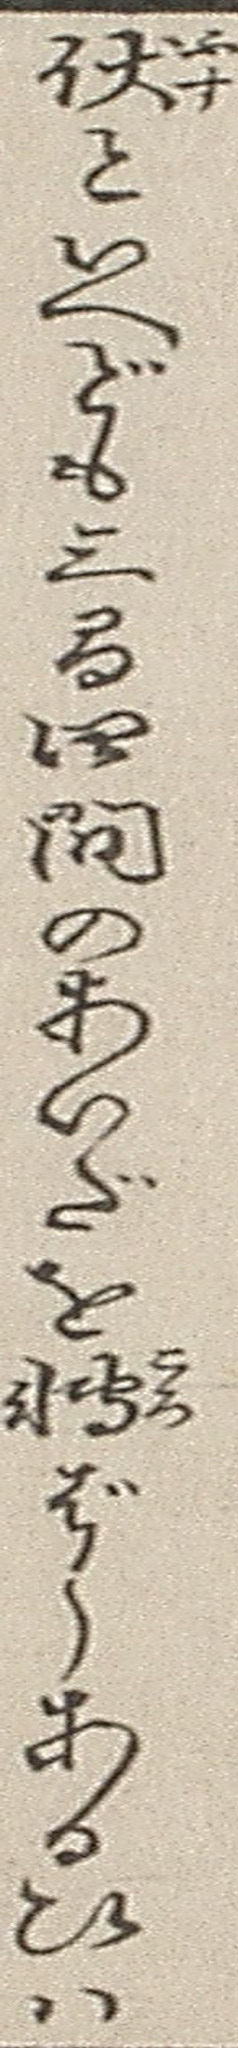伏といへども三間四間のあいだを轉ばしあるひは
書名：大地震暦年考　全
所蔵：東京大学地震研究所図書室 Earthquake Research Institute Library, The University of Tokyo, JAPAN
